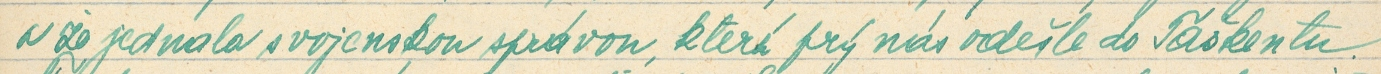a že jednala s vojenskou správou, která prý nás odešle do Taškentu.
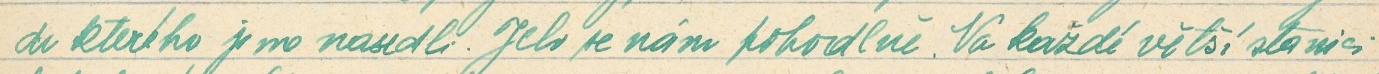do kterého jsme nasedli. Jelo se nám pohodlně. Na každé větší stanici
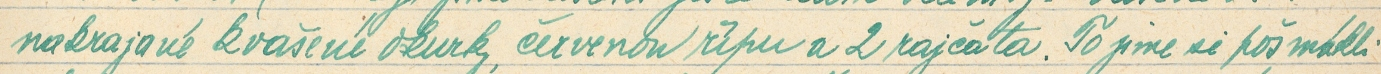nakrajané kvašené okurky, červenou řípu a 2 rajčata. To jsme si pošmákli
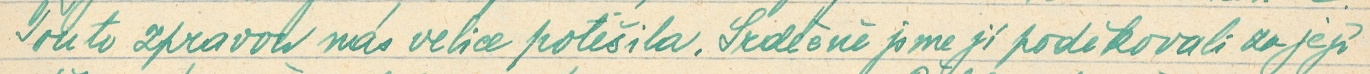Touto zpravou nás velice potěšila. Srdečně jsme jí poděkovali za její
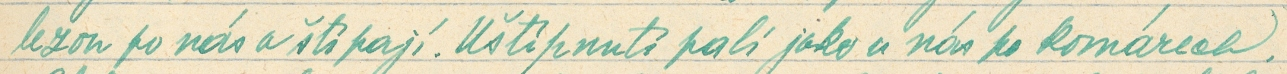lezou po nás a štípají. Uštípnutí palí jako u nás po komárech.
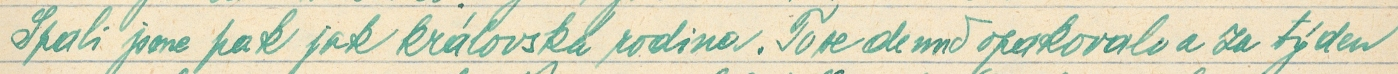Spali jsme pak jak královská rodina. To se denně opakovalo a za týden
